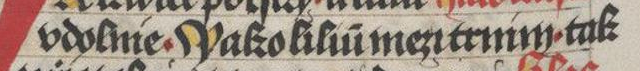vdolnie.Yako liliū mezi trnim. tak
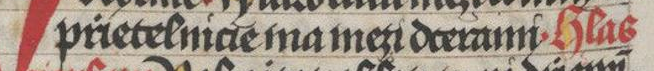pṙietelnicie ma mezi dcerami.Hlas
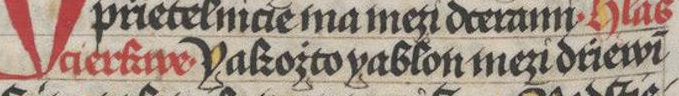cierkwe.Yakożto yablon mezi dṙiewī
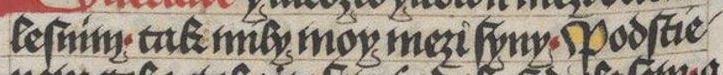leſnim.tak mily moy mezi ſyny.Pod ſtie¬
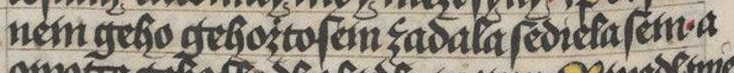nem geho gehożto ſem żadala ſediela ſem.a
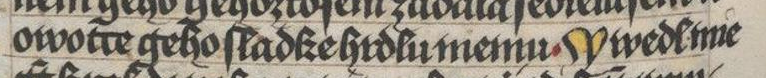owotce geho ſladke hrdlu memu.Y wedl mie
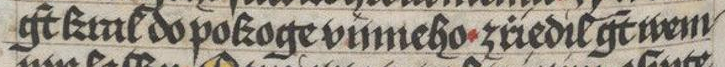ḡt kral do pokoge vinneho.zṙiedil ḡt wem¬
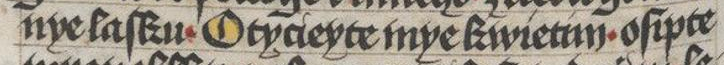nye laſku.Otycieyte mye kwíetím.oſipte
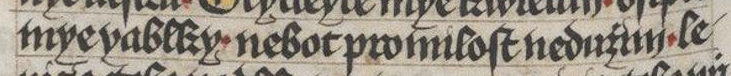mye yablky.nebot promiloſt nedużim. le¬
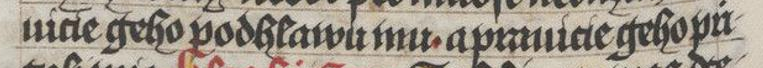uicie geho pod hlawu mu.a prauicie geho pṙi¬
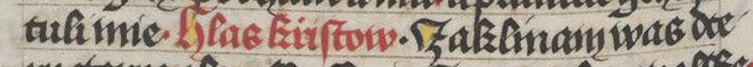tuli mie.Hlas kriſtow.Zaklinam was dce¬
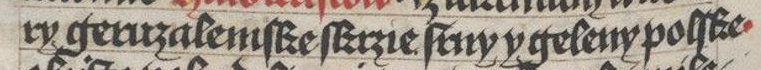ry geruzalemſke ſkrzie srny y geleny polſke.
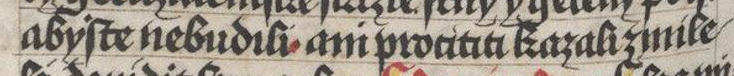abyẛte nebudili.ani procititi kazali zmile¬
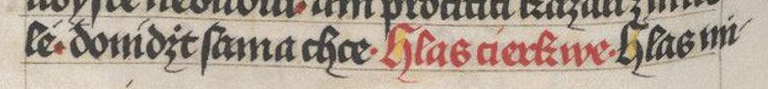le.donidżt sama chce.hlas cierkwe.hlas mi¬
